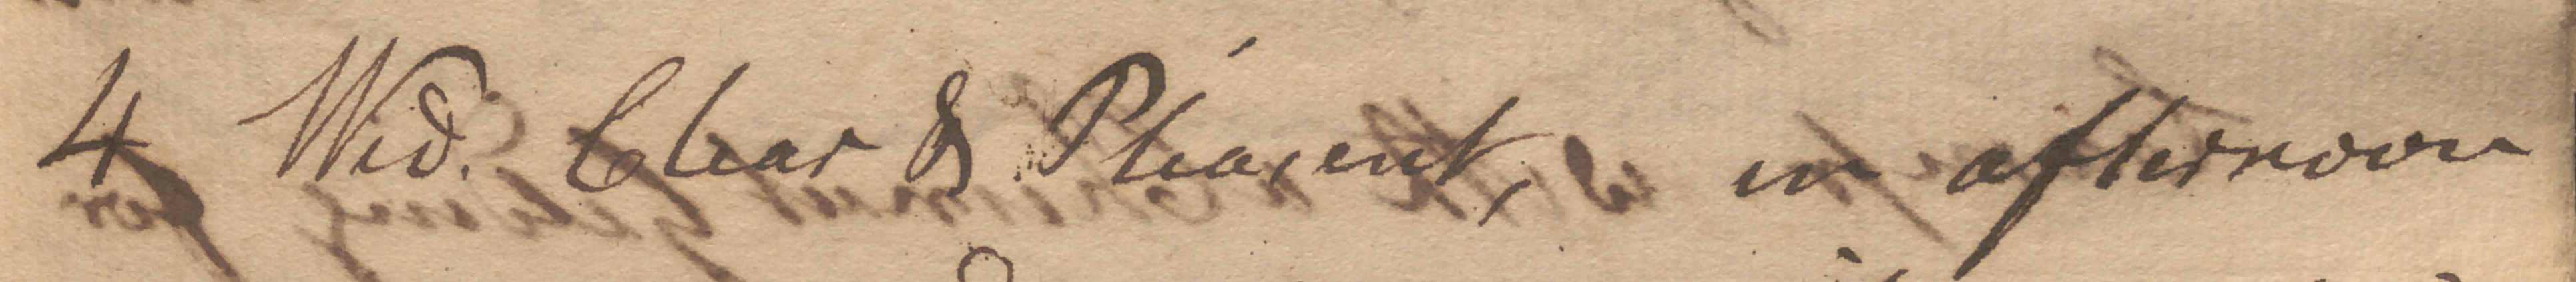4n Wed. Clear & Pleasent, in afternoon
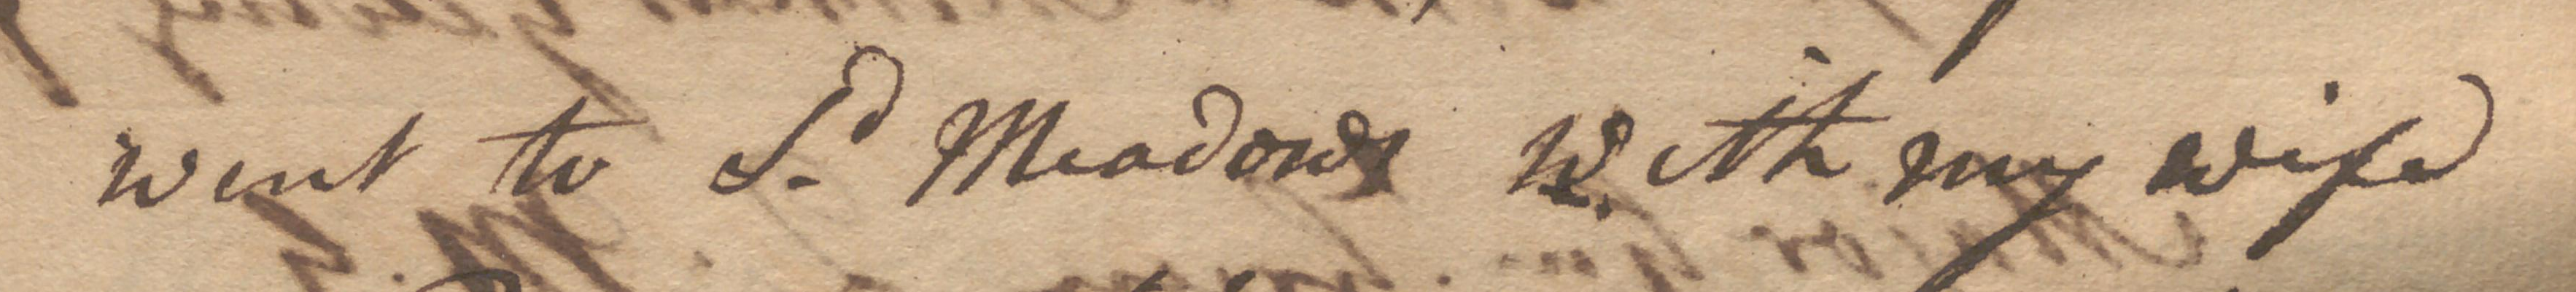went to s^d. Meadows with my wife
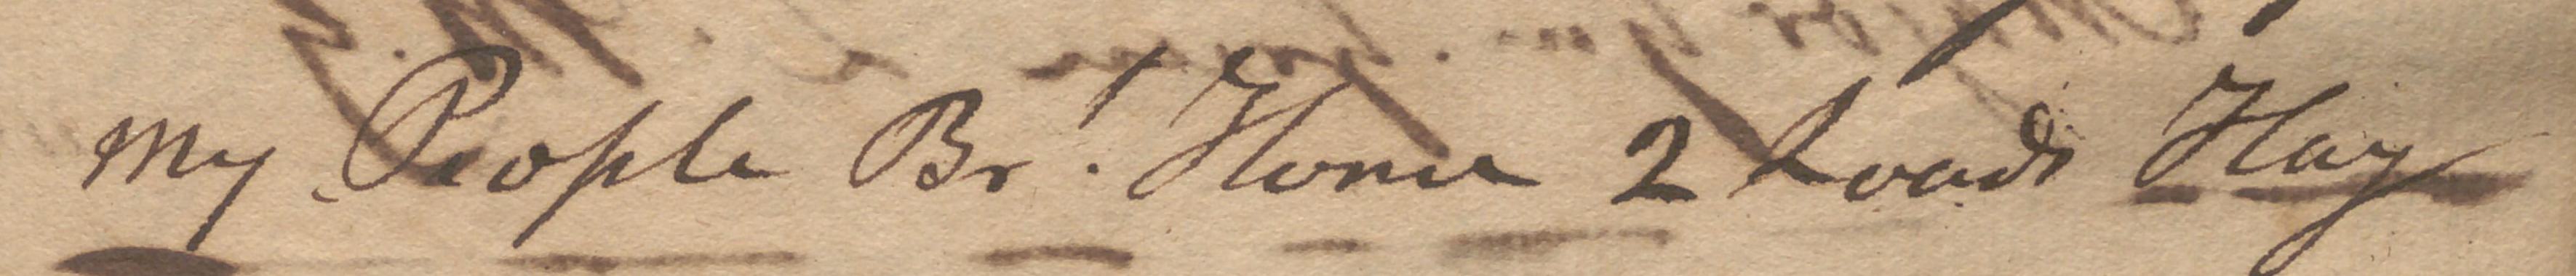My People Br^t. Home 2 Loads Hay
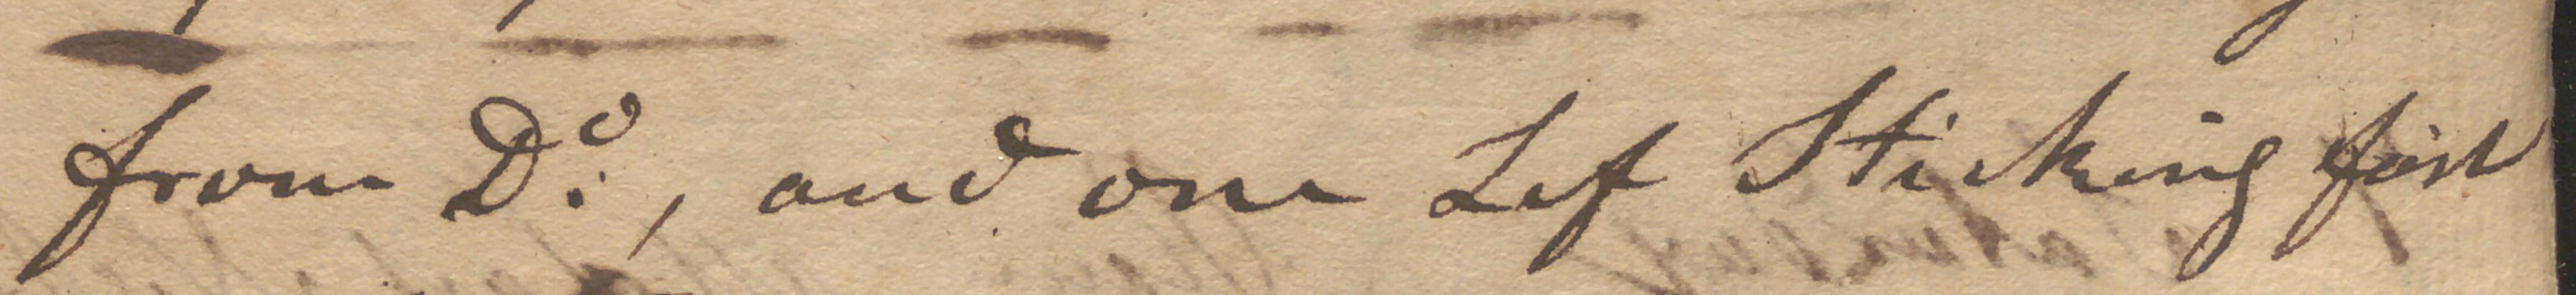from D^o., and one Let Sticking fast
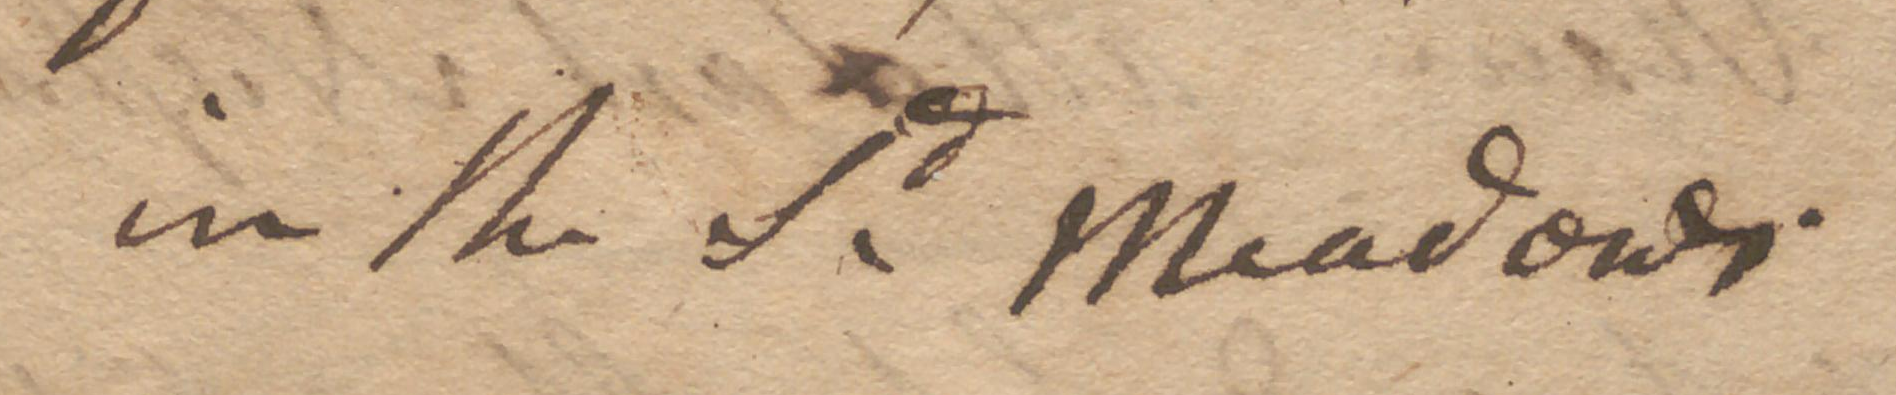in the s^d. Meadows
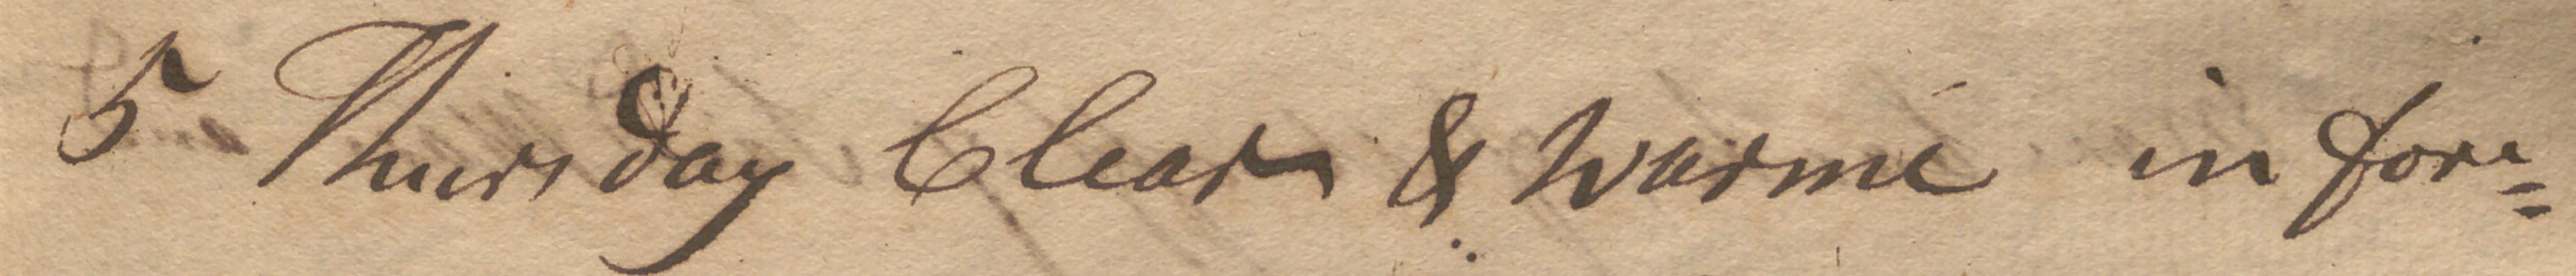5 Thursday Clear & warme in for-
